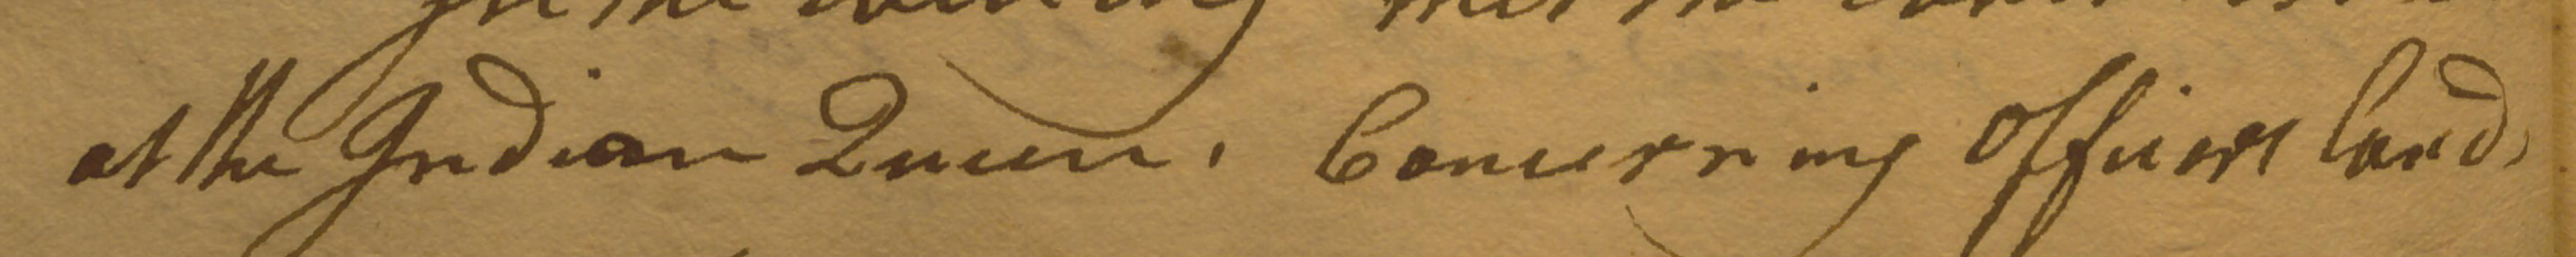at the Indian Queen, Concerning officers lard
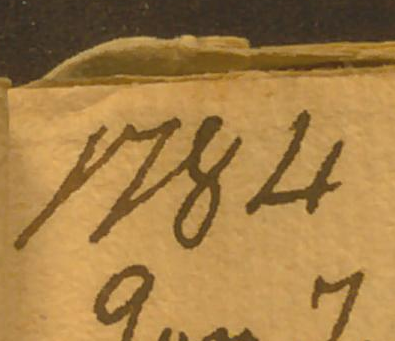1784
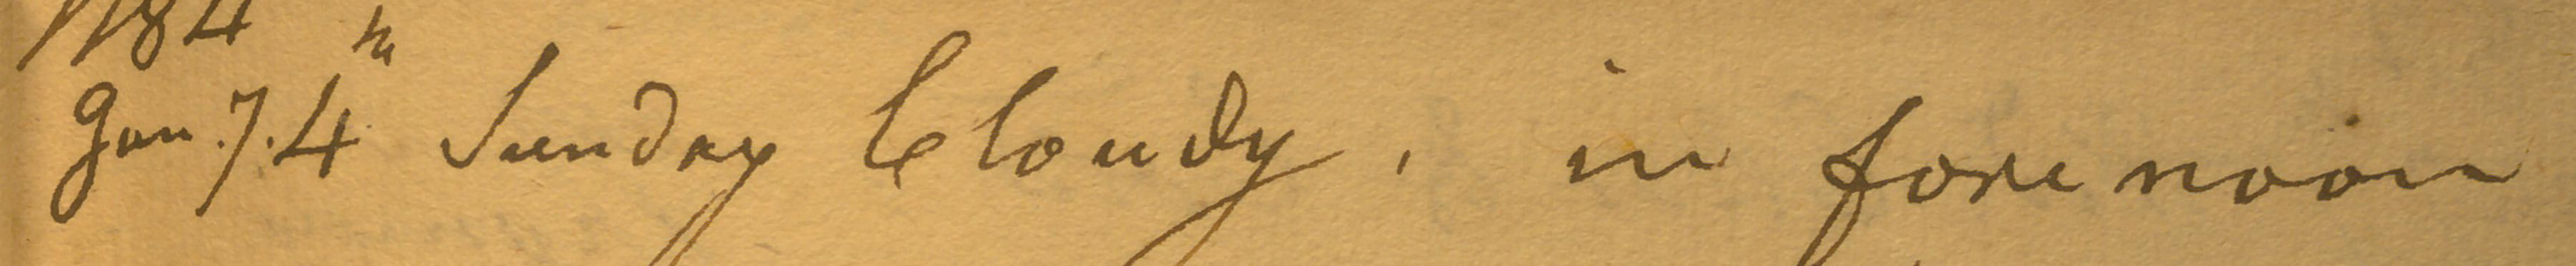Jan^y. 4^th Sunday Cloudy, in forenoon
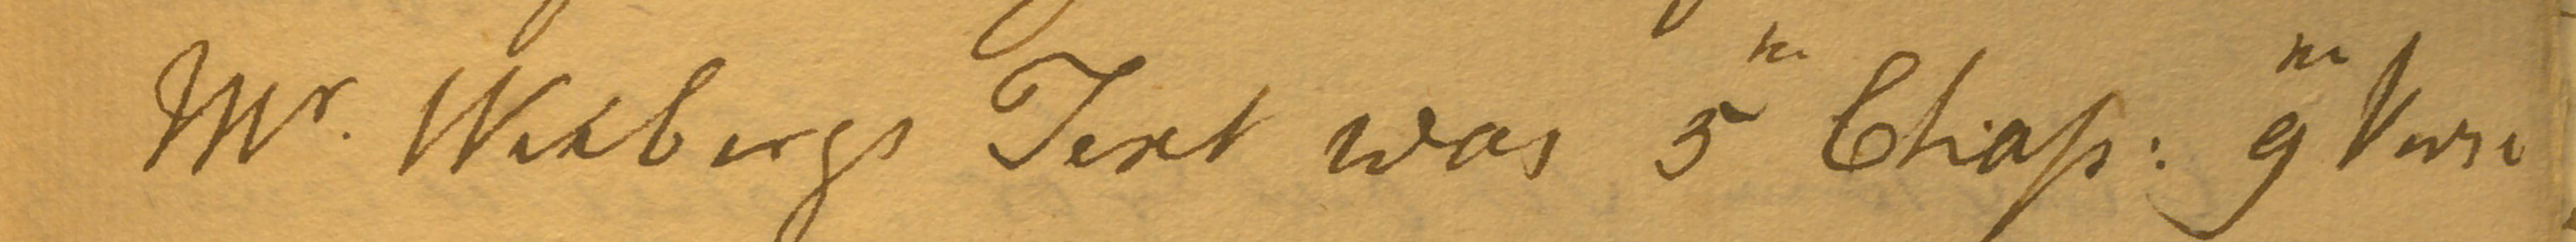M^r. Weibergs Text was 5^th Chap. 9^th Verse
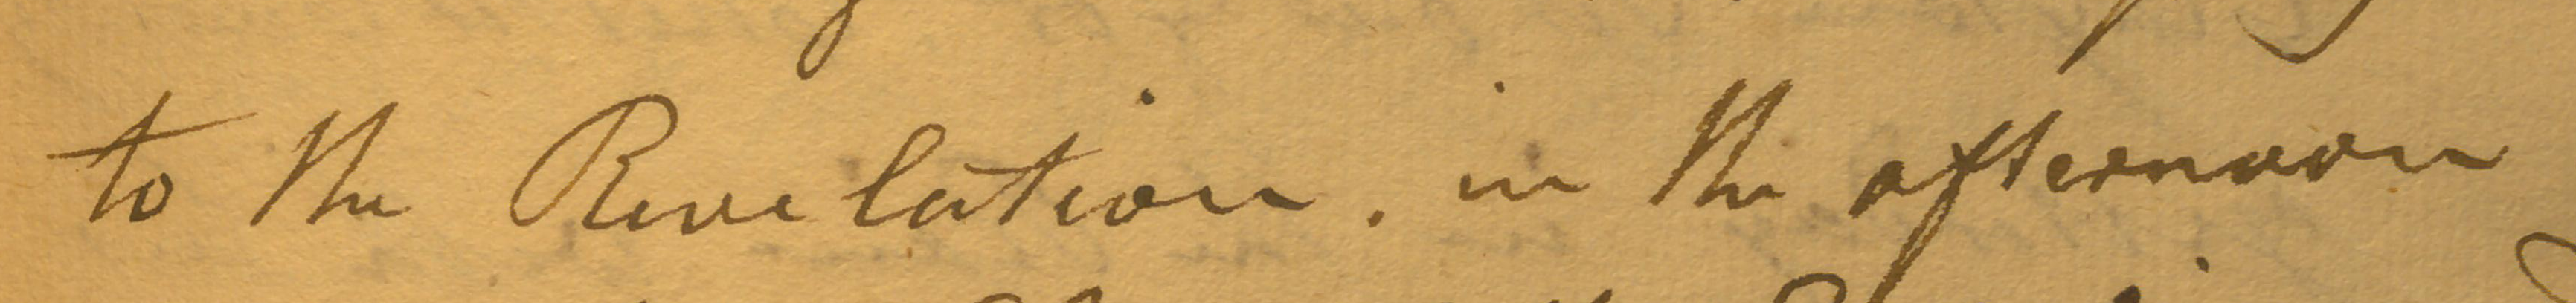to the Revelation in the afternoon
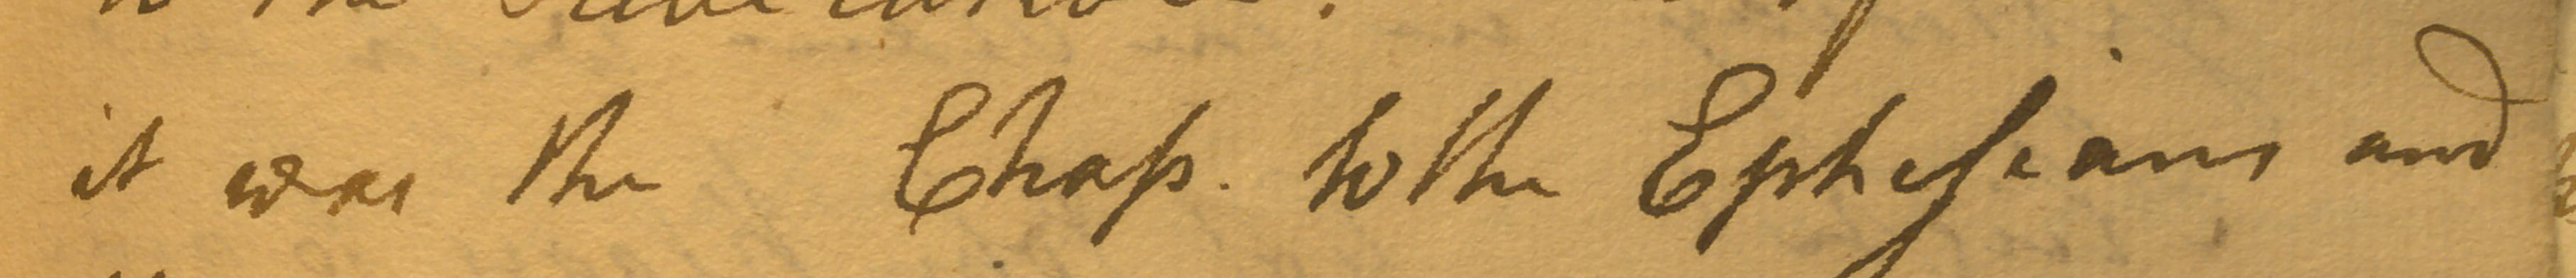it was the Chap. to the Ephesians and
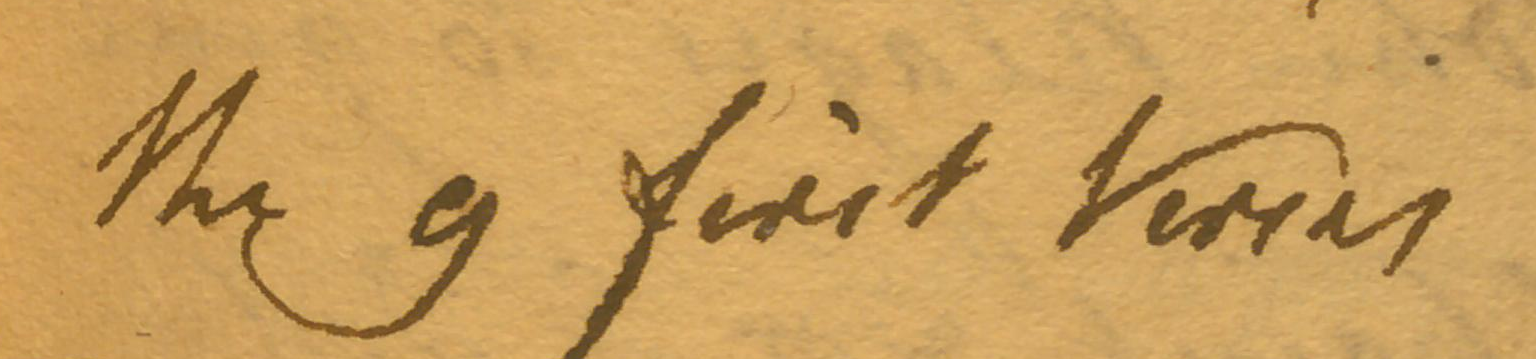the 9 first Verses
